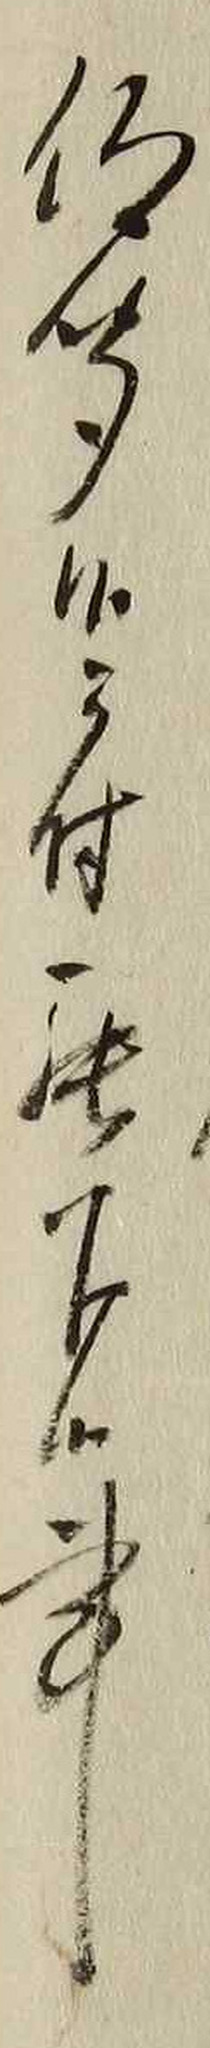仰聞候ニ付罷下候事
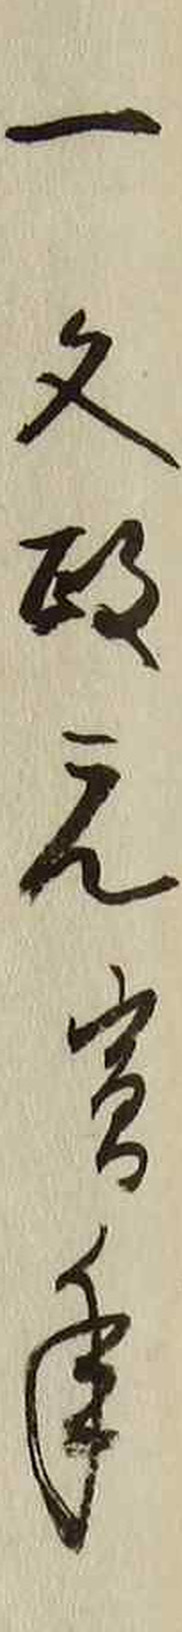一文政元寅年
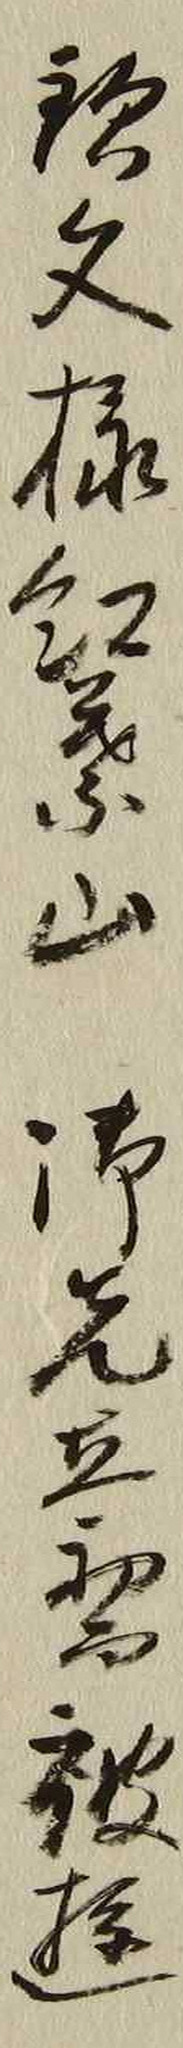欽文様紅葉山御先立初而被遊
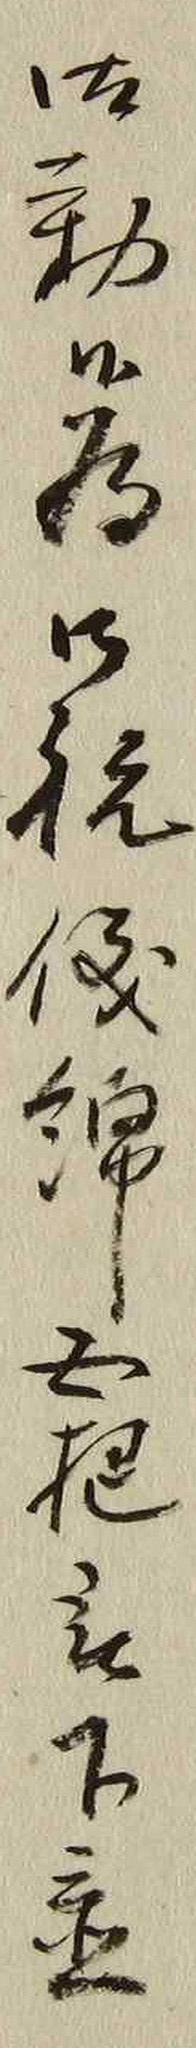御勤候為御祝儀綿五把被下置
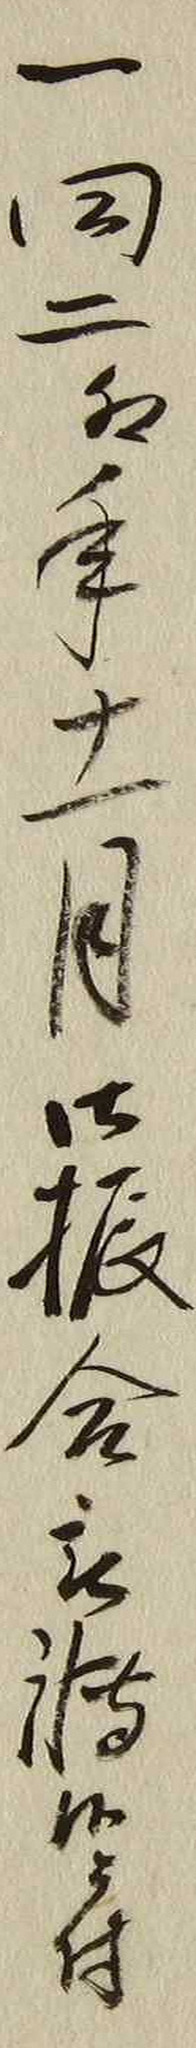一同二卯年十一月御振合被転候ニ付
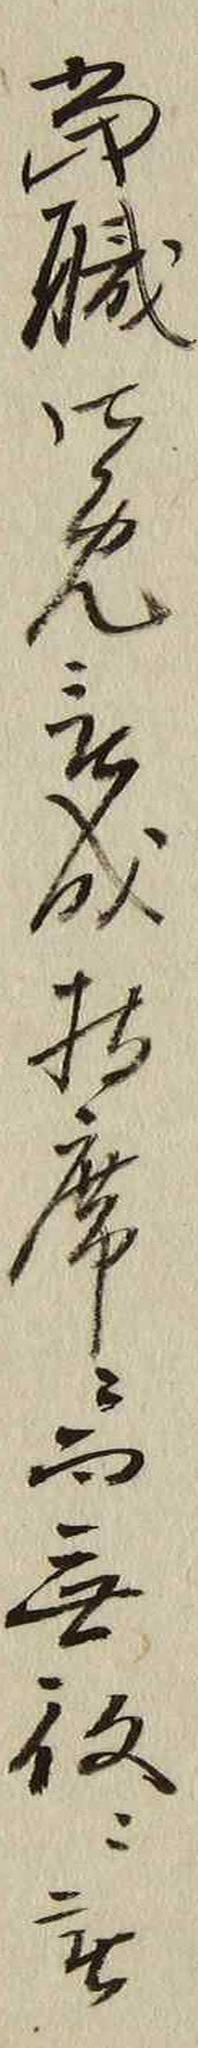当職御免被成持席ニ而無役ニ被
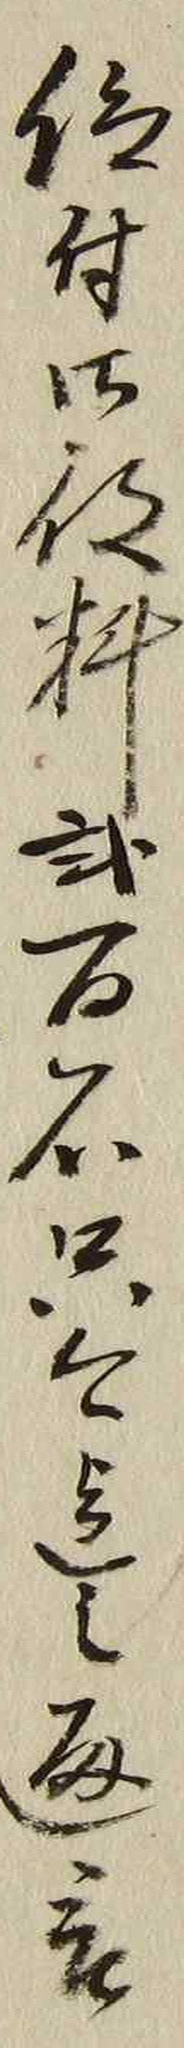仰付御役料弐百石只今迄之通被
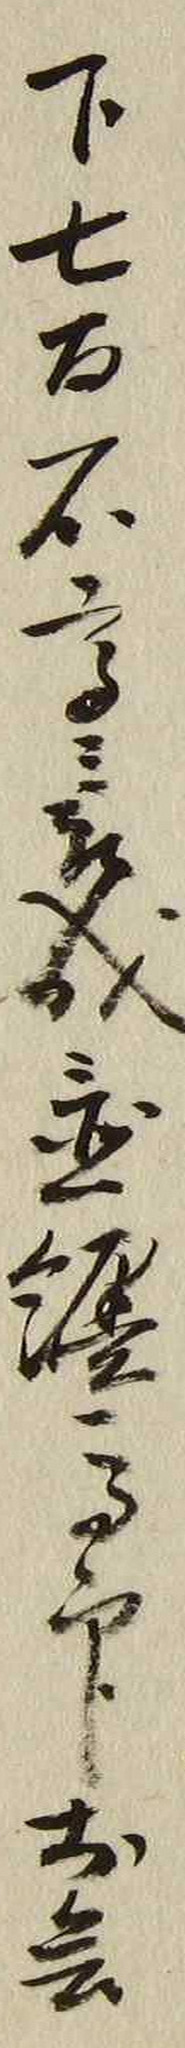下七百石高ニ被成置纏馬印於会
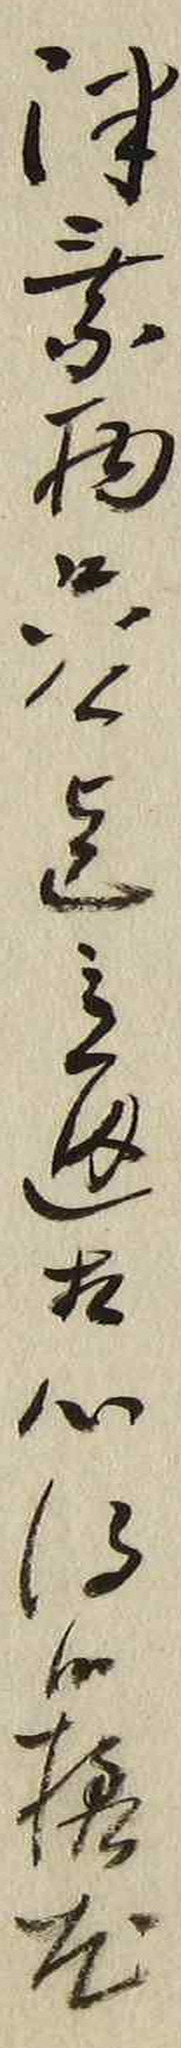津乗物只今迄之通相心得候様尤
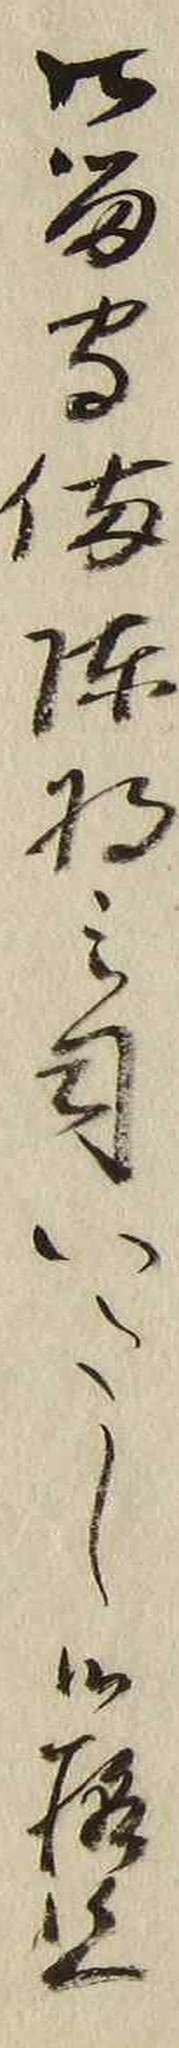御留守備陣持之司いたし御様且

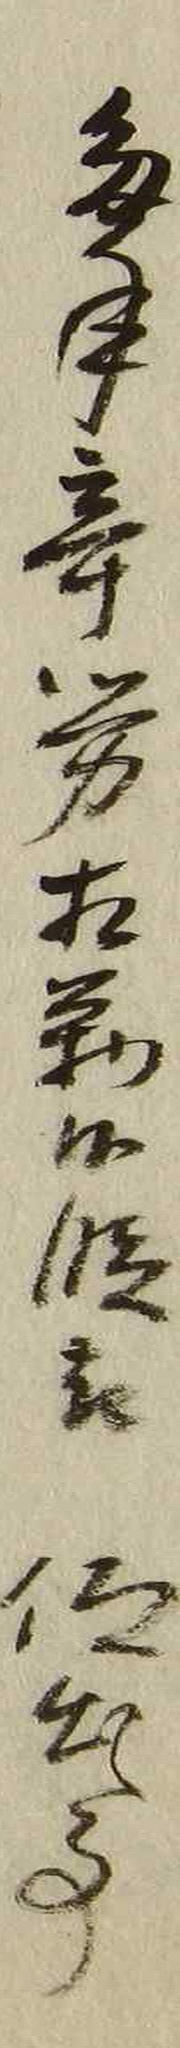多年辛労相勤候段被仰出候事
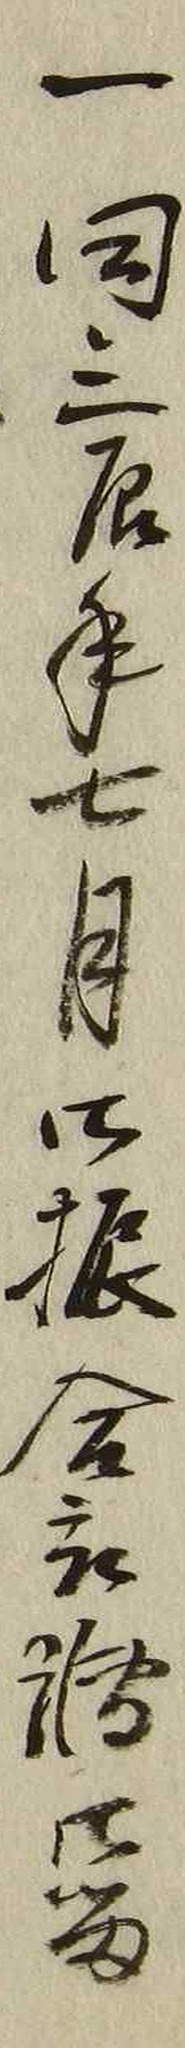一同三辰年七月御振合被転御留
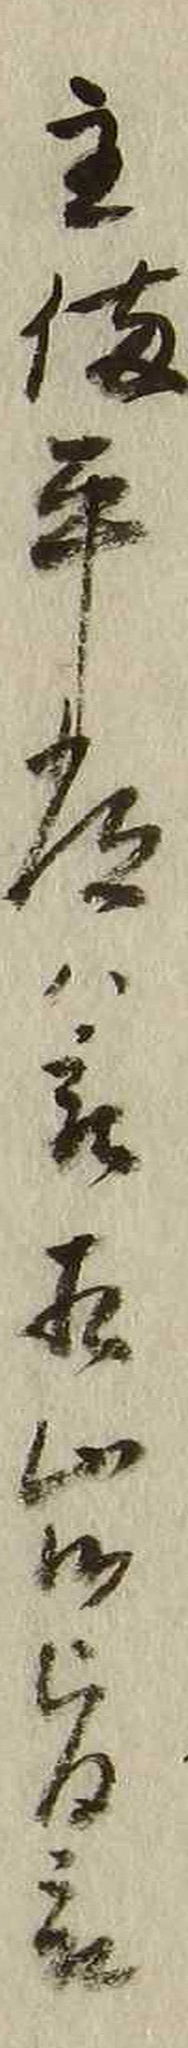主備平常ハ被相止候旨被
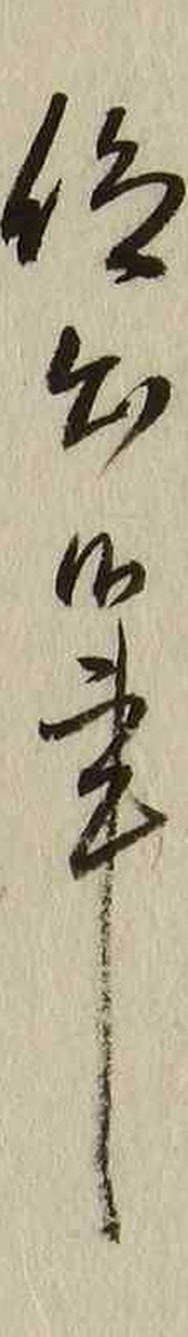仰出候事
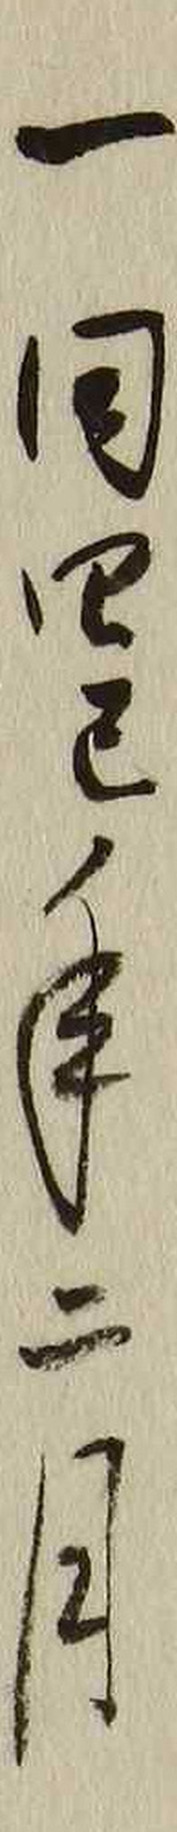一同四巳年二月
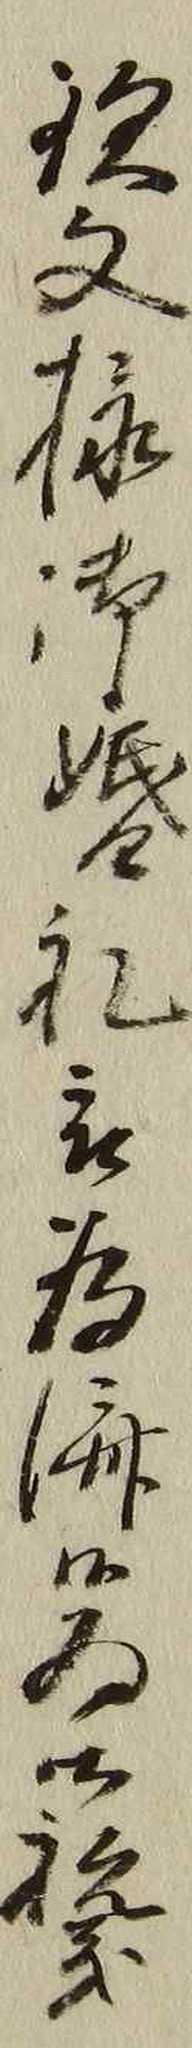欽文様御婚礼被為済候為御祝義
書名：諸士系譜　巻之351　す之部1
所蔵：会津若松市立会津図書館
